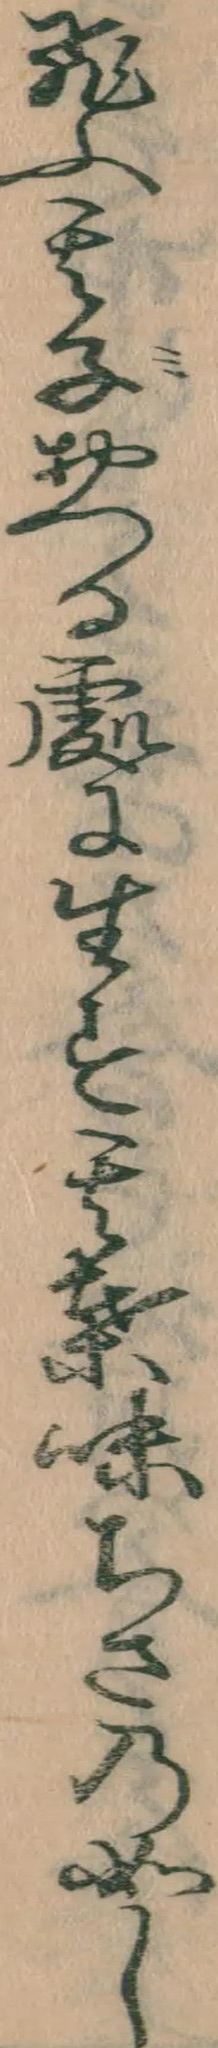飛ふ其子おつる処に生す其葉味ちさの如し
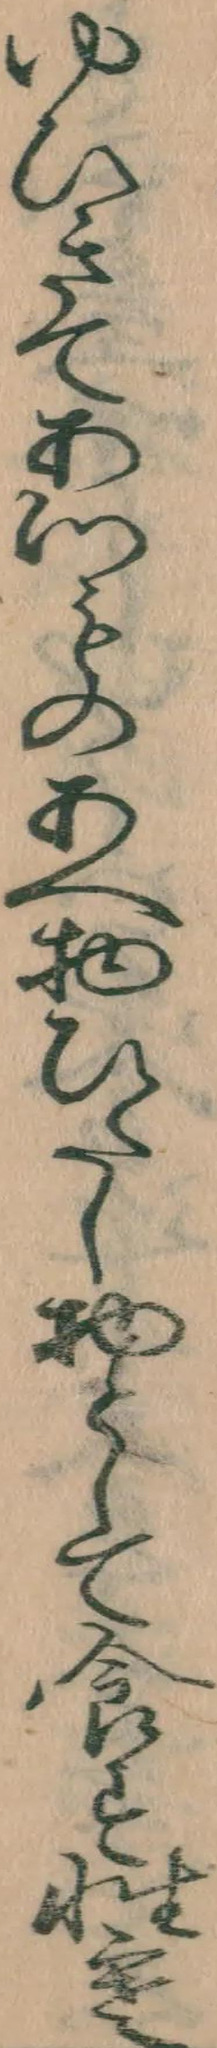ゆひきてあつものあへ物ひたし物として食す性寒
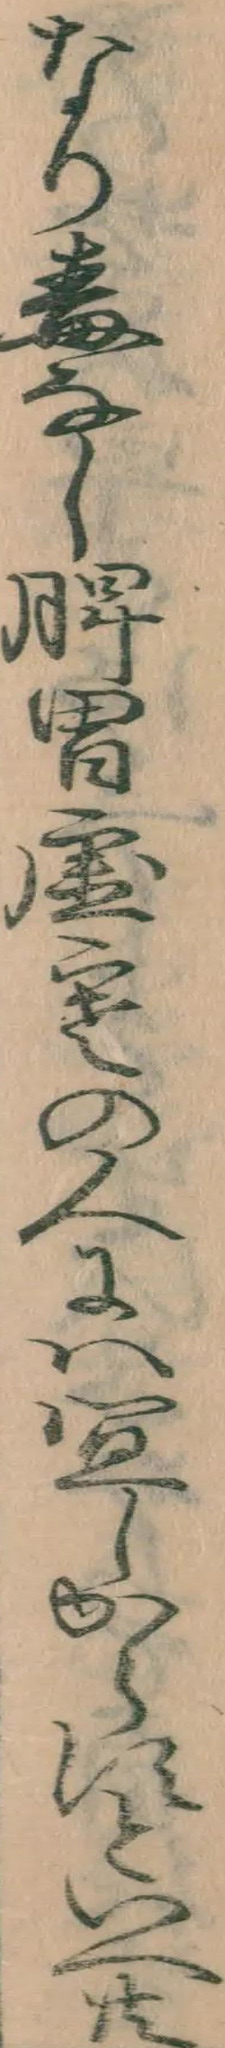なり毒なし脾胃虚寒の人には宜しからすといへ共
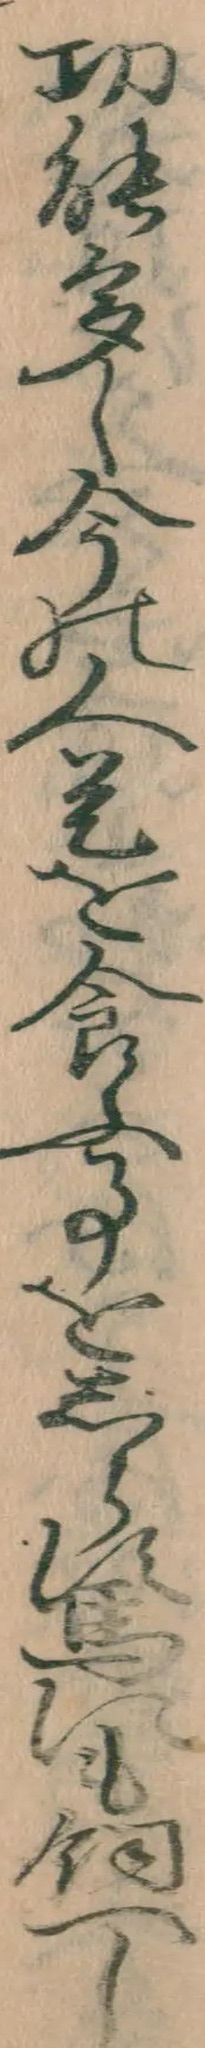功能多し今の人是を食ふ事をしらす馬にもし飼へし
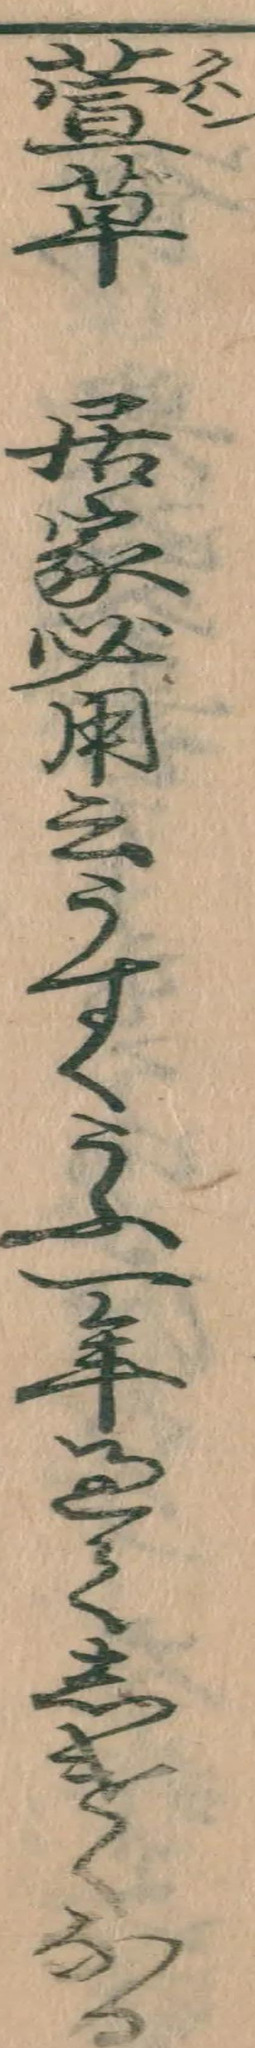萱草居家必用云うすくうふ一年過てしけくなる
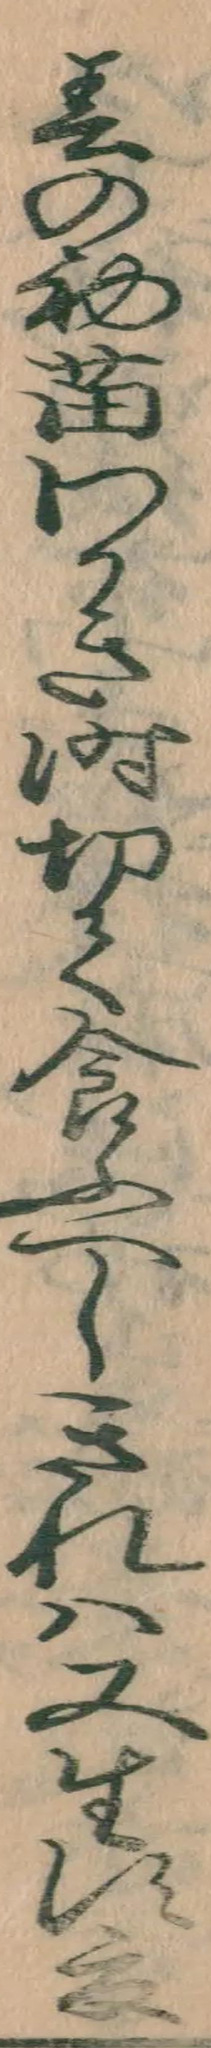春の初苗わかき時切て食ふへしきれは又生す夏
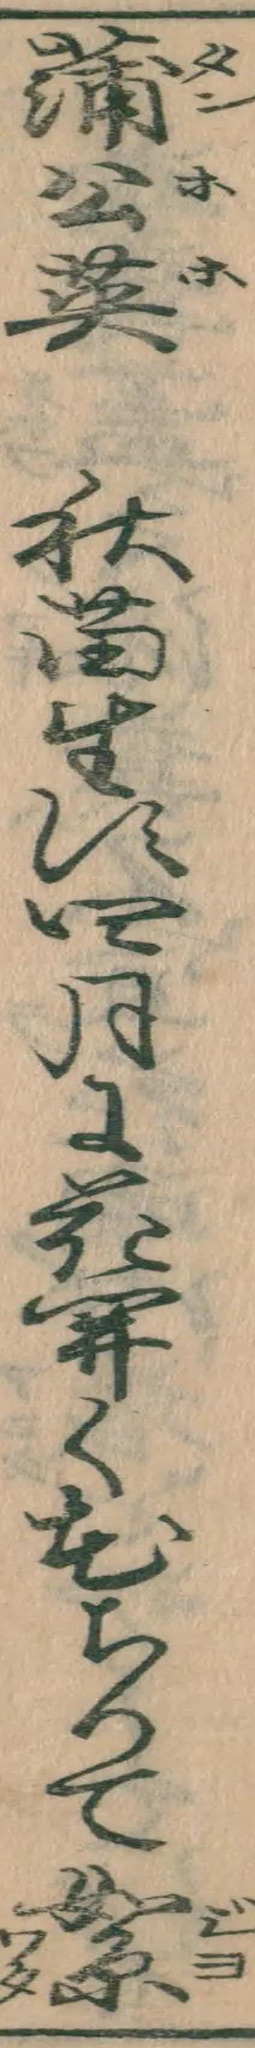蒲公英秋苗生す四月に花開く花ちりて絮
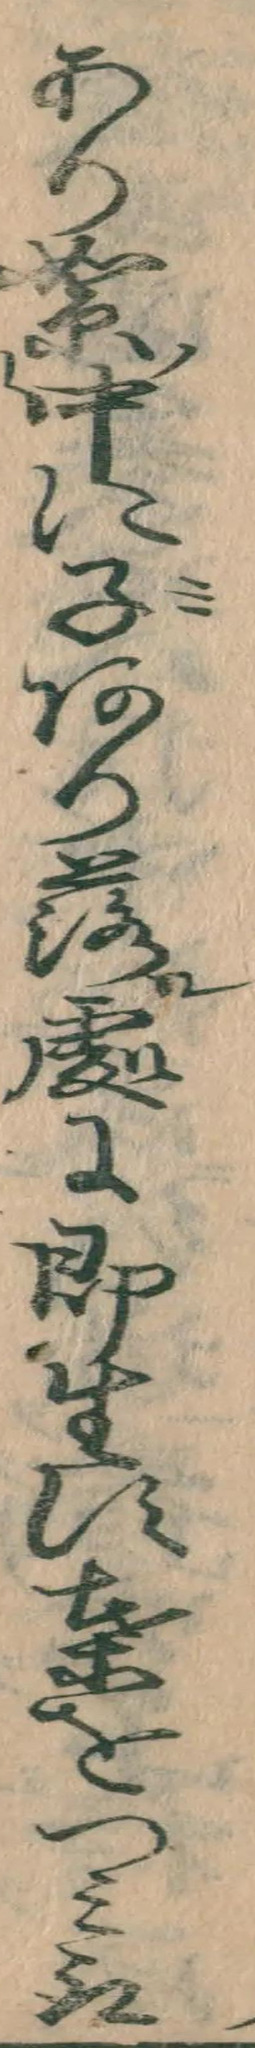あり絮中に子あり落処に即生す葉をつみ取
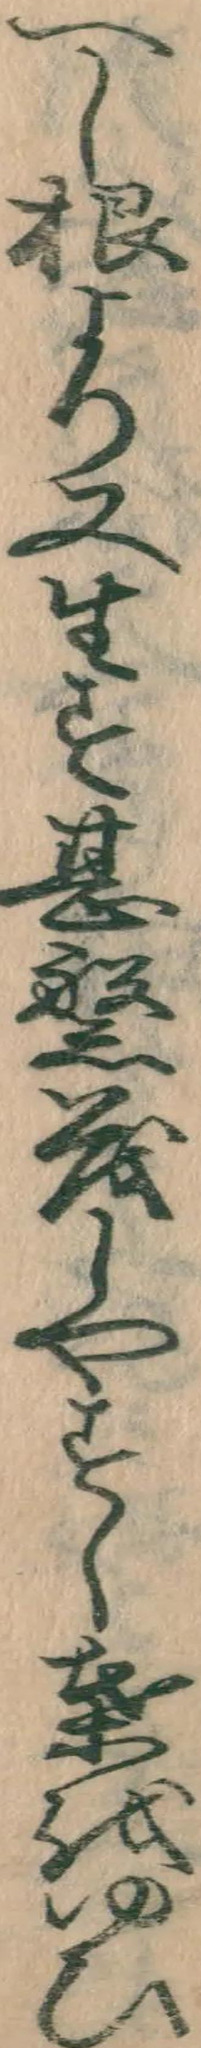へし根より又生す甚磐茂しやすし葉をゆひ
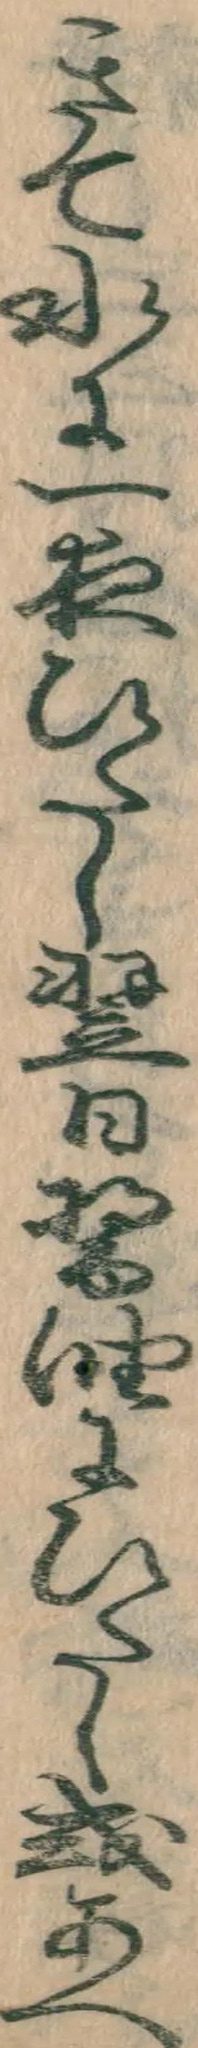きて水に一夜ひたし翌日醤油にひたし或あへ
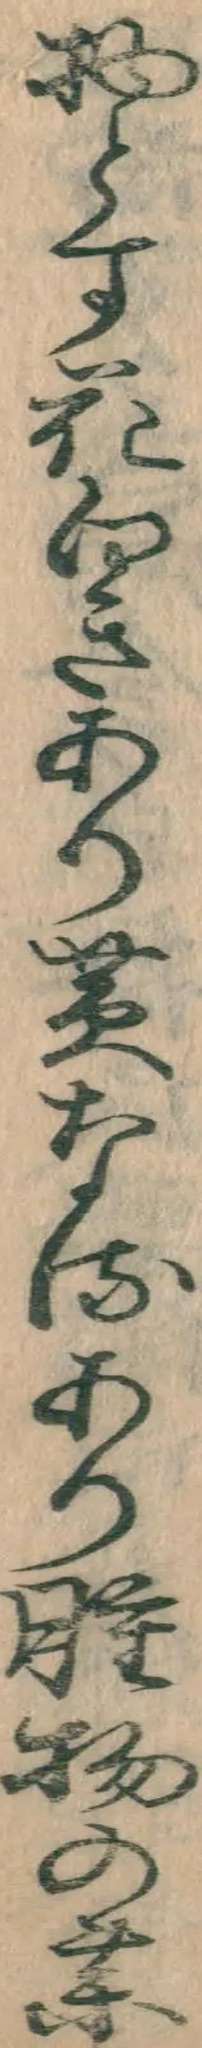物とす花白きあり黄なるあり腫物の薬

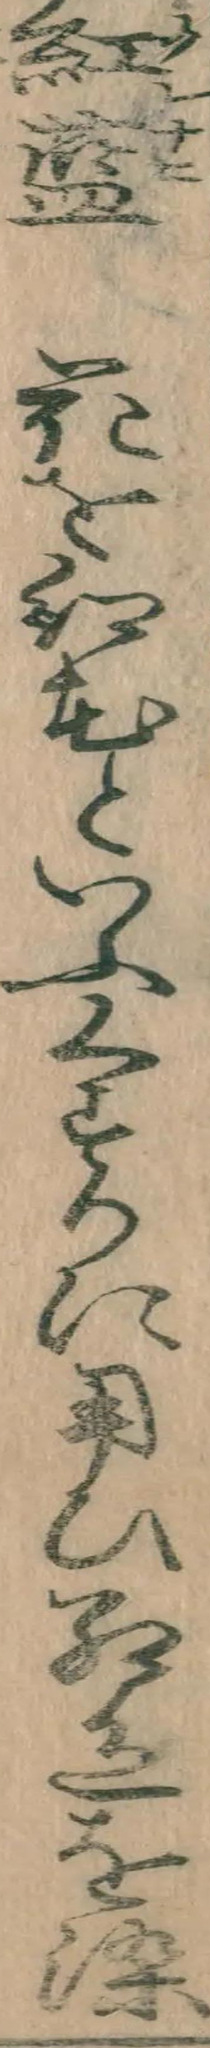紅藍花を紅花といふくすりに用ひ紅色を染
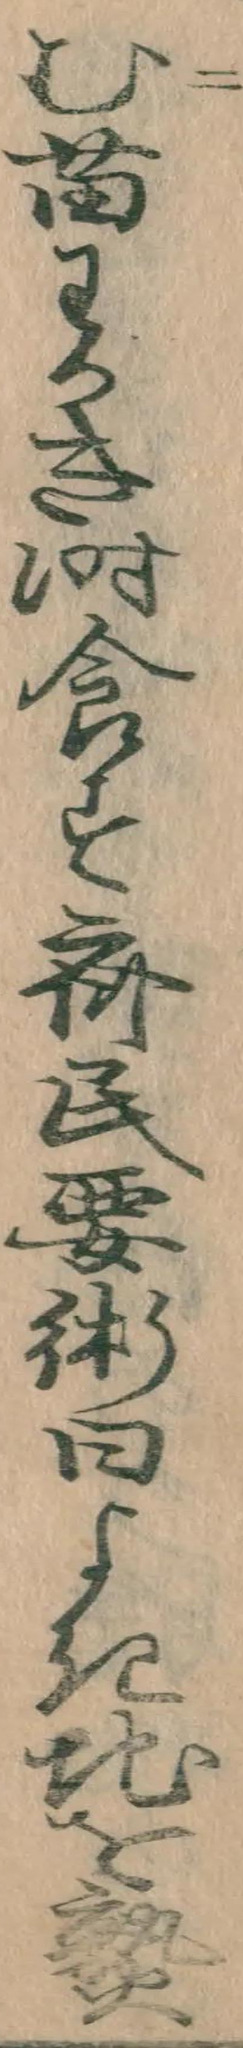む苗わかき時食す斉民要術曰よき地を熟
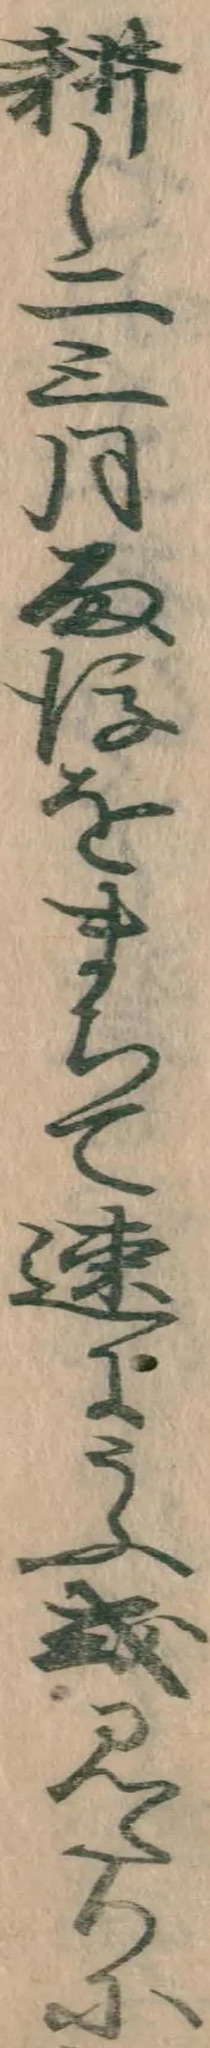耕し二三月雨後を待ちて速にうふ或みたりに
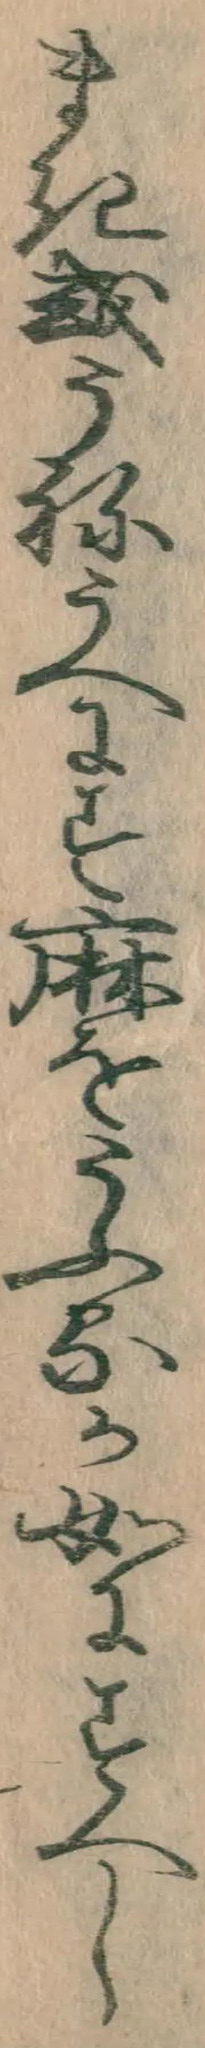まき或うねうへにす麻をうふるか如にすべし
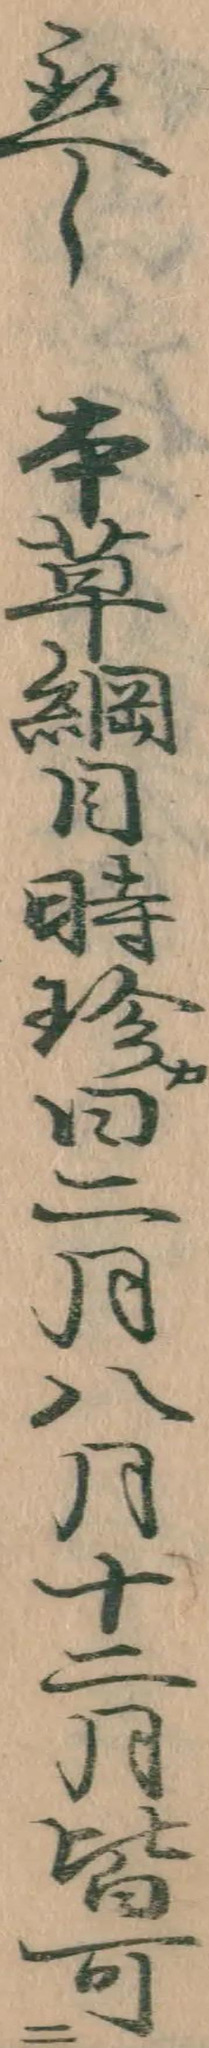取へし本草綱目時珍曰二月八月十二月皆可
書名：菜譜 3巻
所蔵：国立国会図書館 National Diet Library, JAPAN
